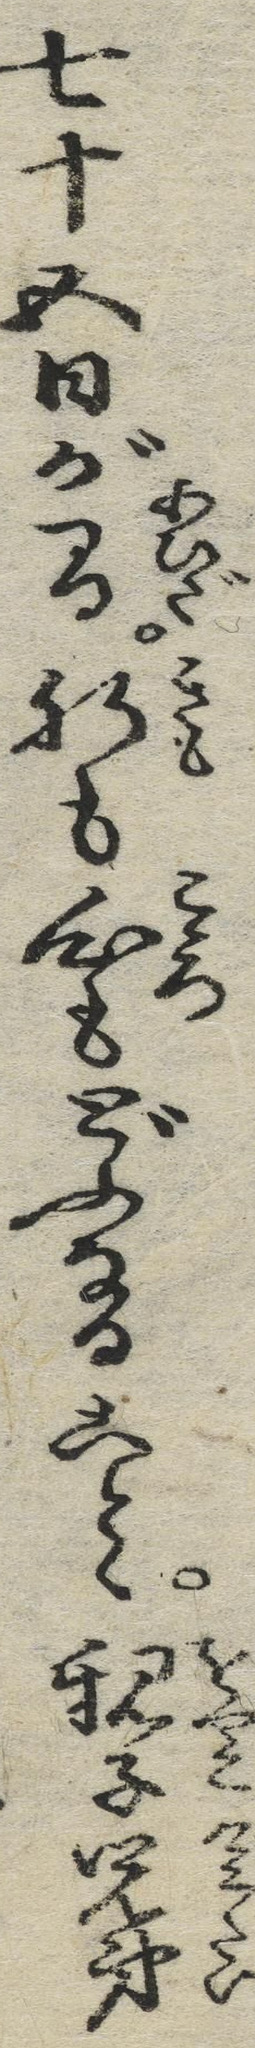七十五日が間。肝も心もどうなることゝ。親子兄弟
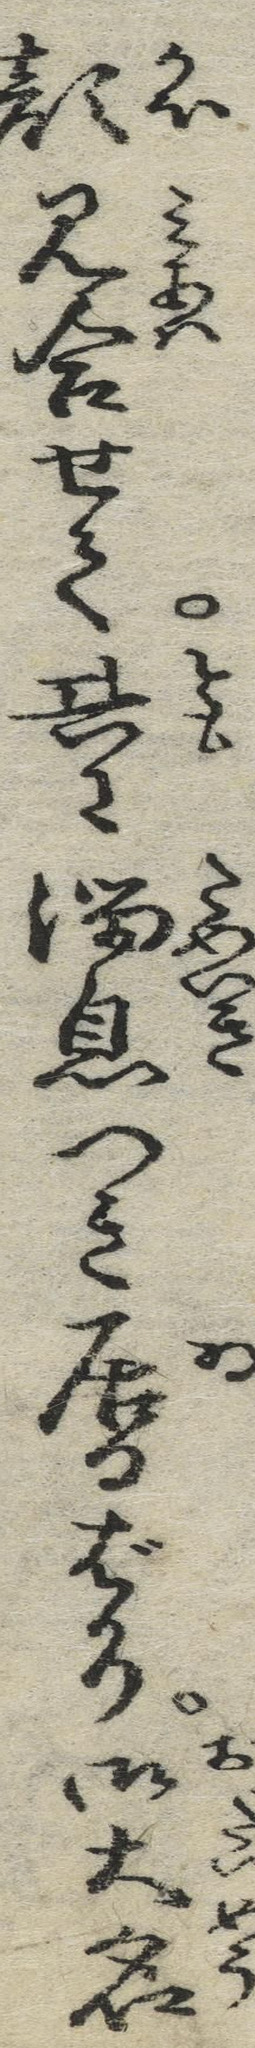顔見合せて。共に溜息つき居るばかり。御大名
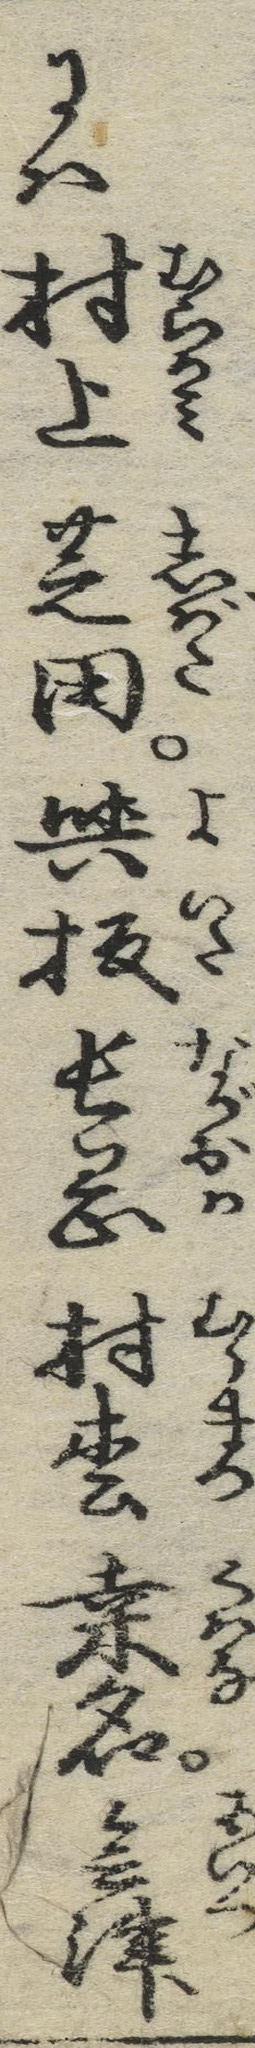には村上芝田。与板長岡村松桑名。会津
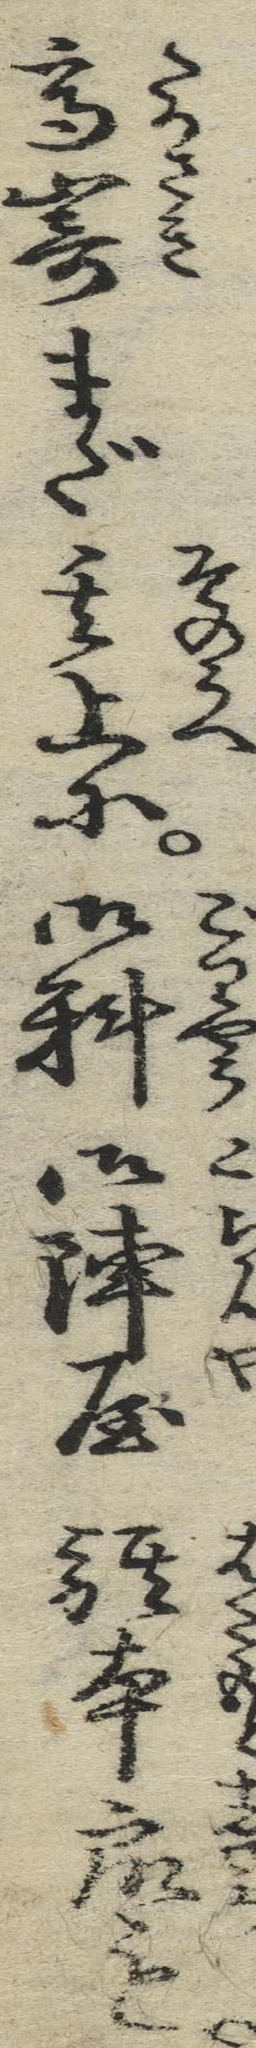高崎まだ其上に。御料御陣屋旗本衆も。

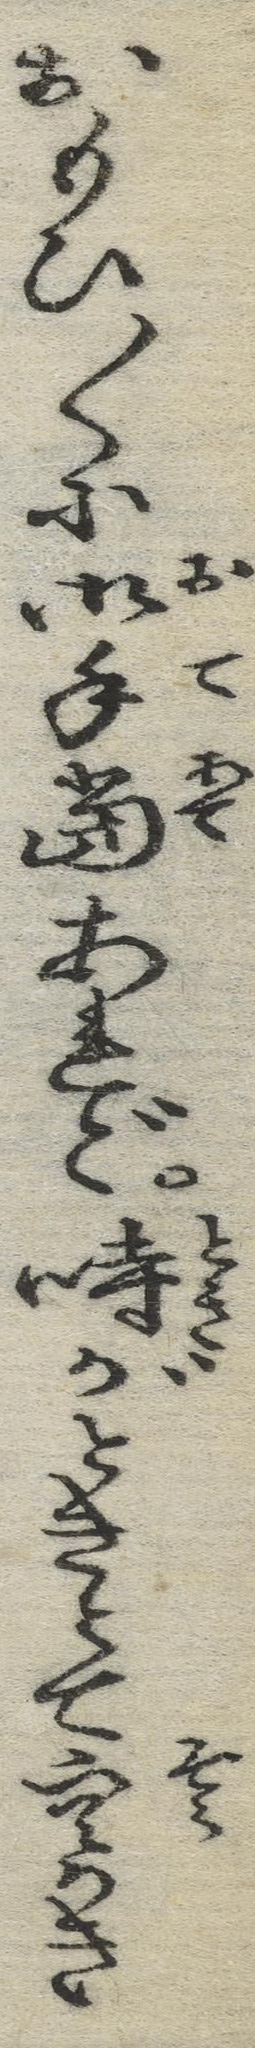おもひ〳〵に御手当あれど。時がときとて空かき
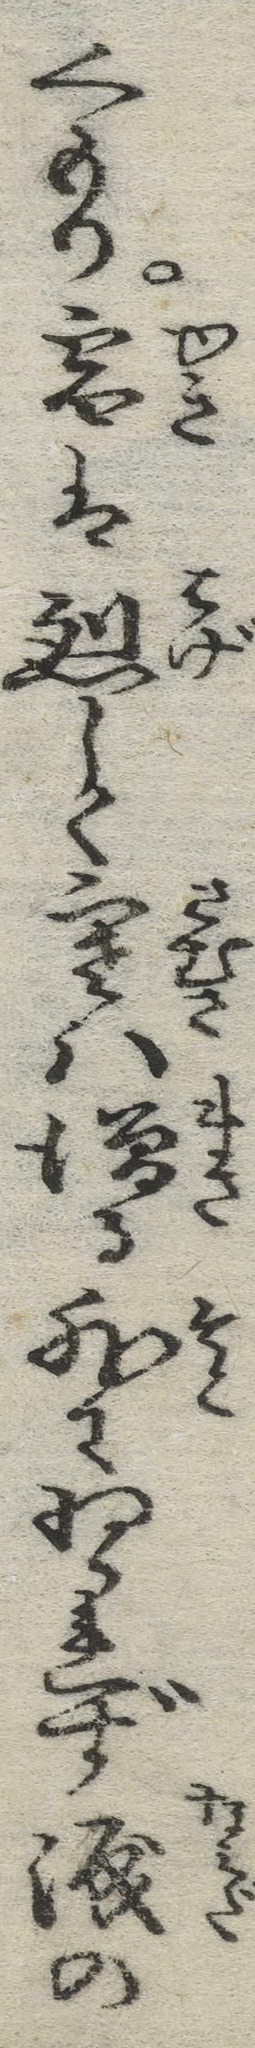くもり。雪は烈しく寒は増る外にねられず涙の
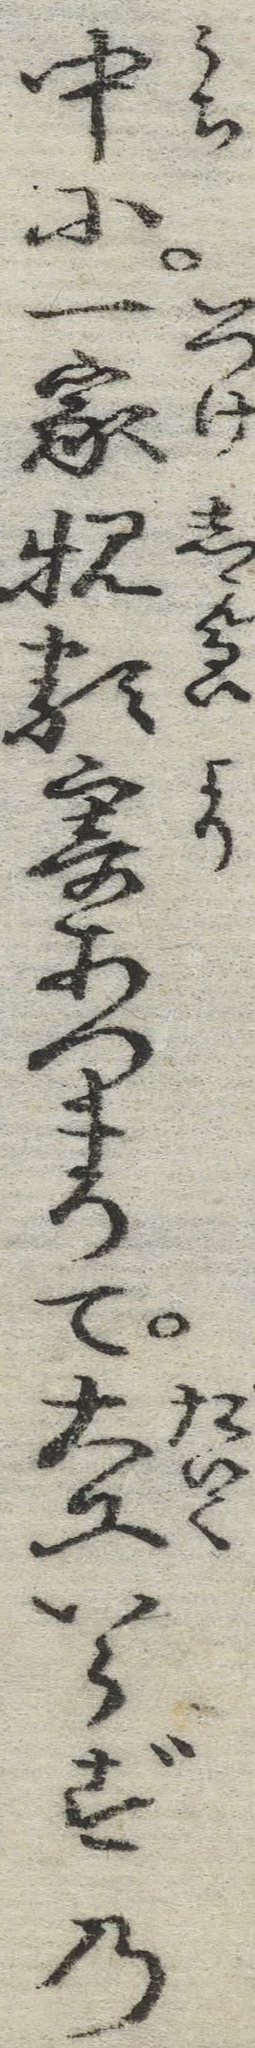中に。一家親類寄あつまつて。大工いらずの
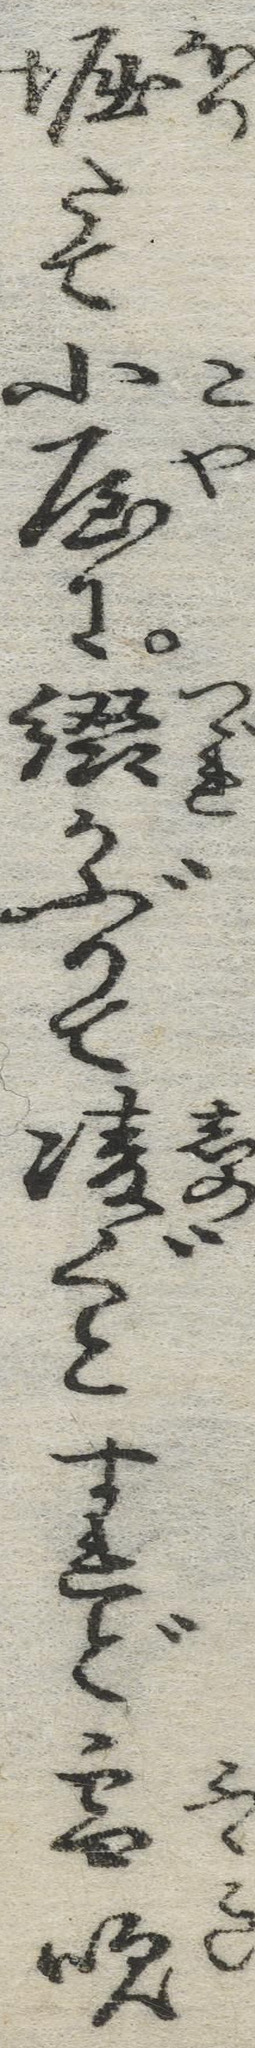堀たて小屋に。綴かぶりて凌ぐとすれど吹雪
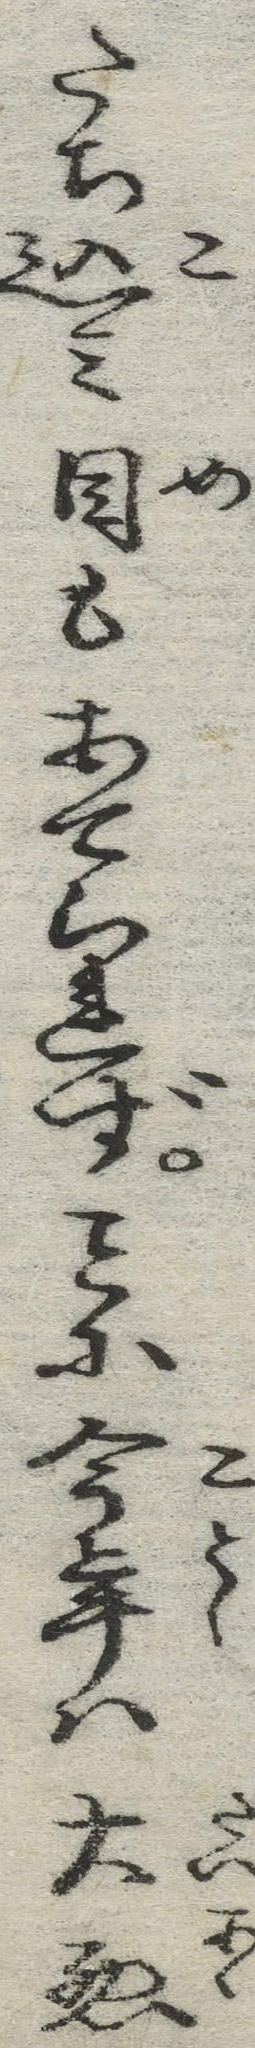たち込み目もあてられず。ことに今年は大悪
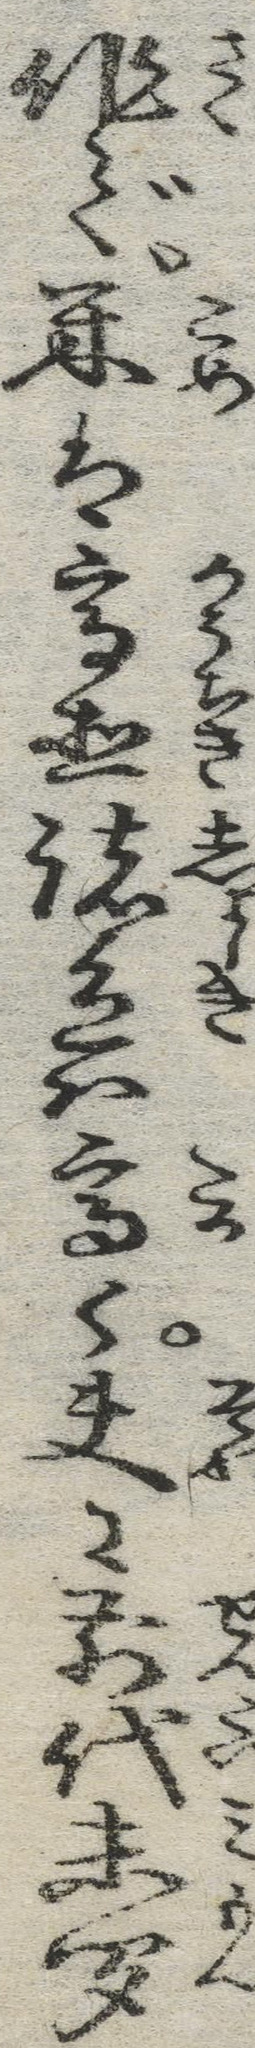作で。米は高直諸色は高く。夫に前代未聞
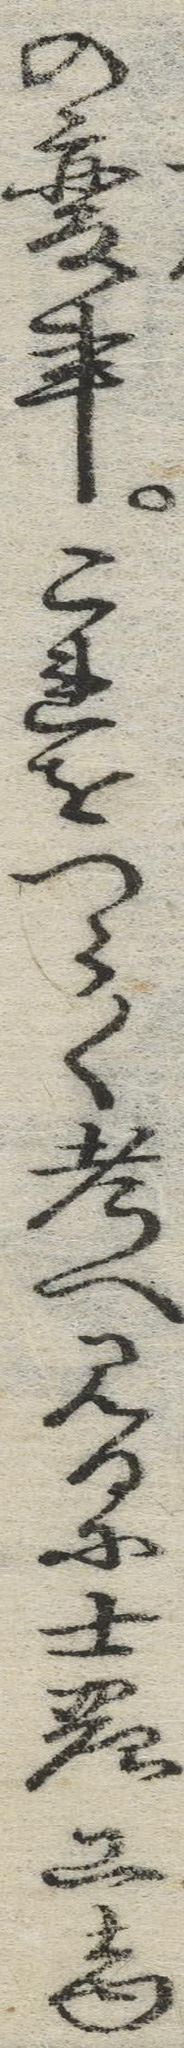の変事。これをつら〳〵考へ見るに。士農工商
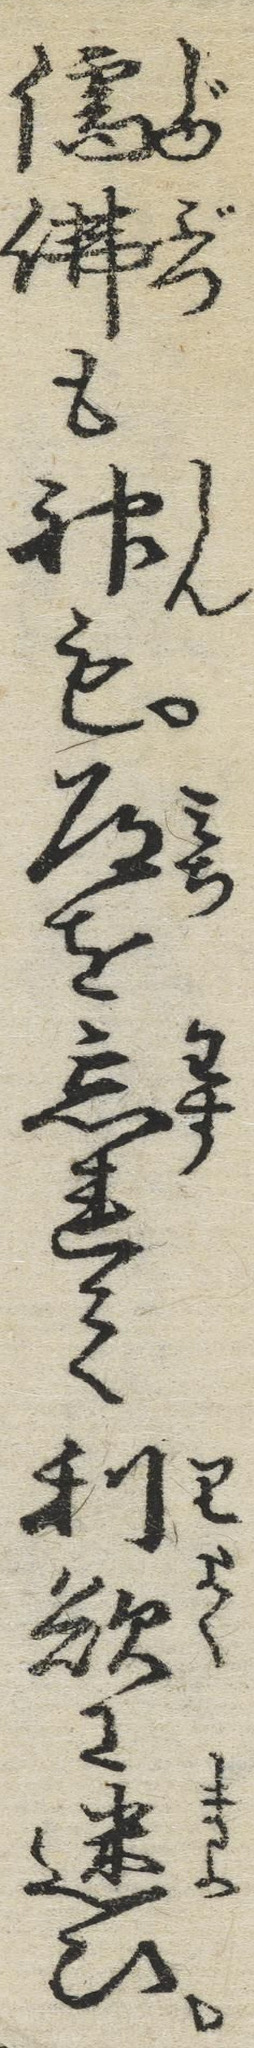儒仏も神も。道を忘れて利欲に迷ひ
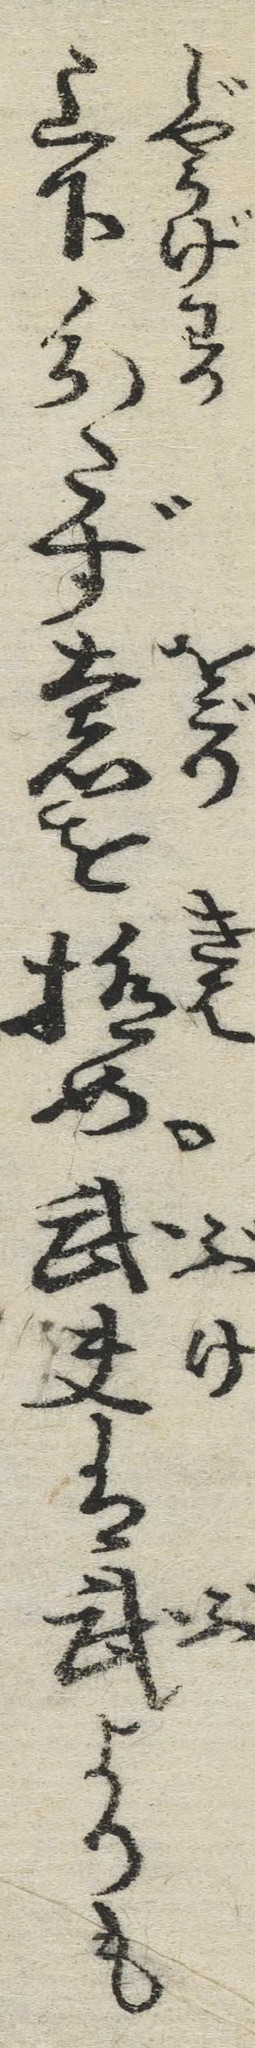上下分たず奢を極め。武夫は武よりも
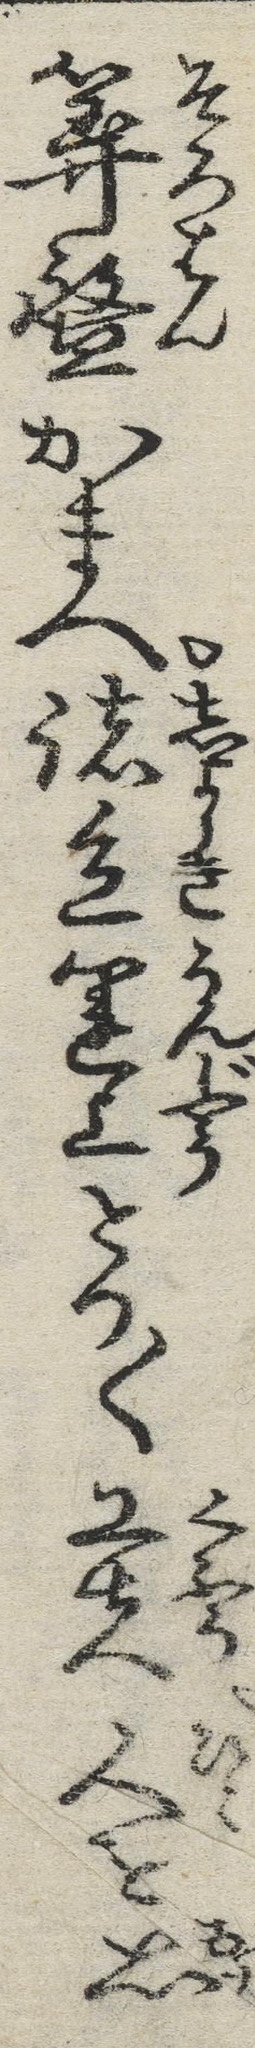算盤かまへ。諸色運上とつ〳〵工夫。人を思
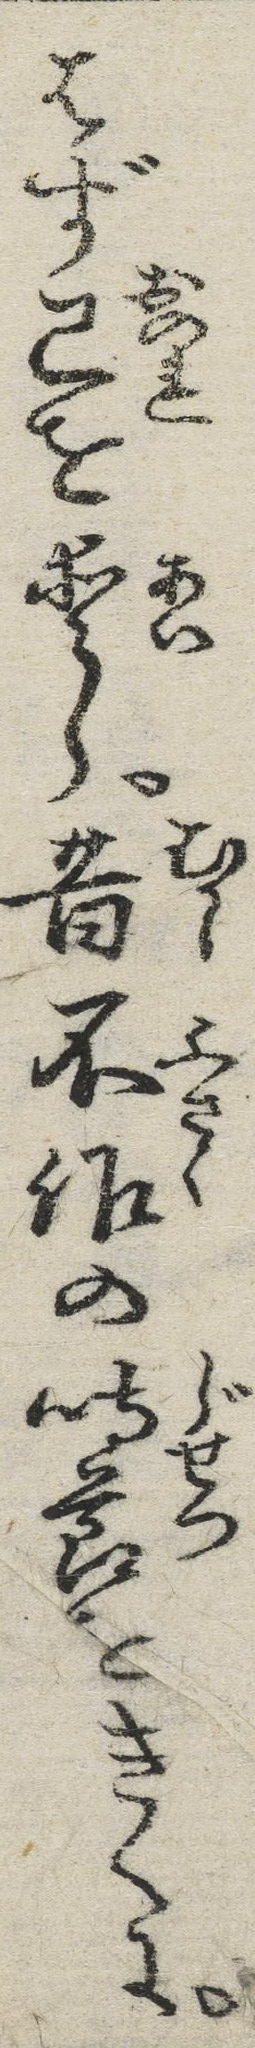はず己を愛し。昔不作の時節をきくに。
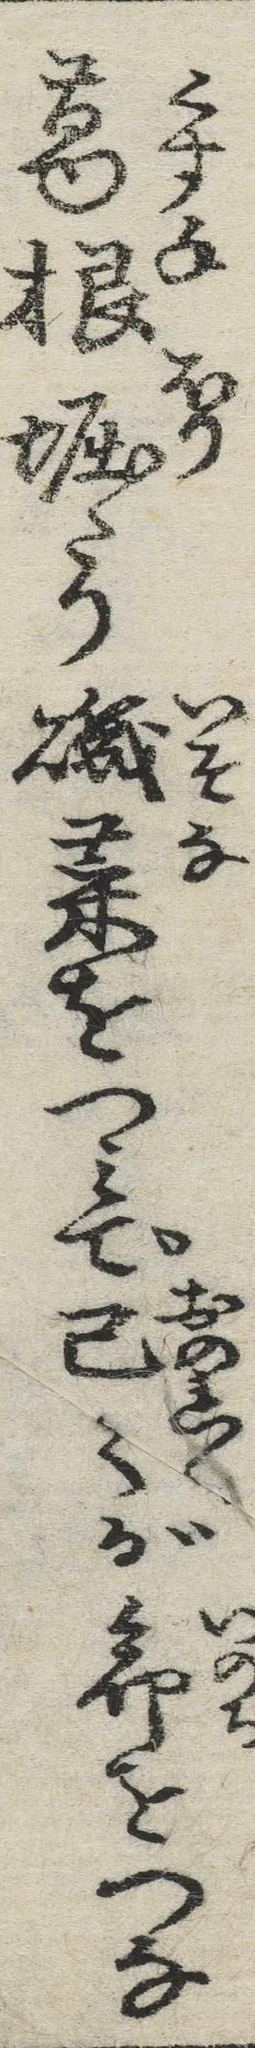葛根堀たり磯菜をつみて。己らが命をつな
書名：越後地震口説
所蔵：東京大学地震研究所図書室 Earthquake Research Institute Library, The University of Tokyo, JAPAN
